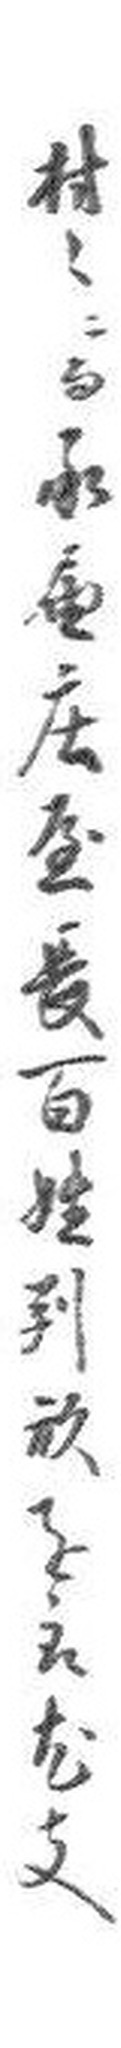村々ニ而承届庄屋長百姓判形を取尤支
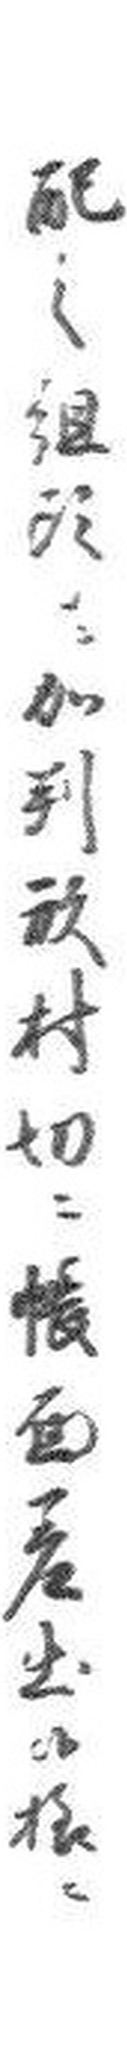配之組頭も加判形村切ニ帳面差出候様ニ

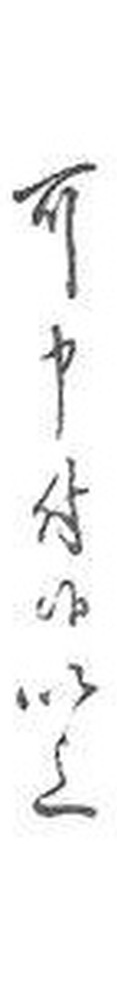可申付候以上
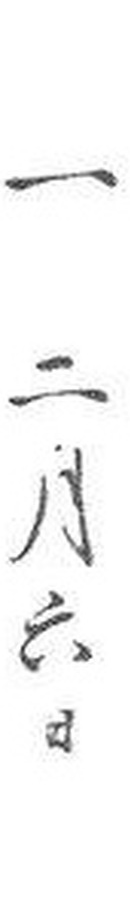一二月六日
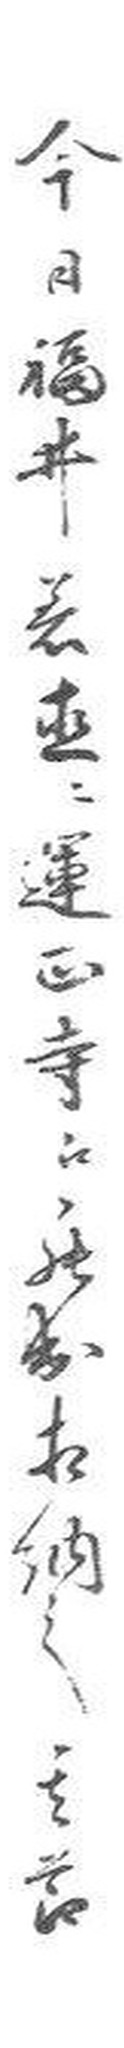今日福井着直ニ運正寺江罷出相納之其節
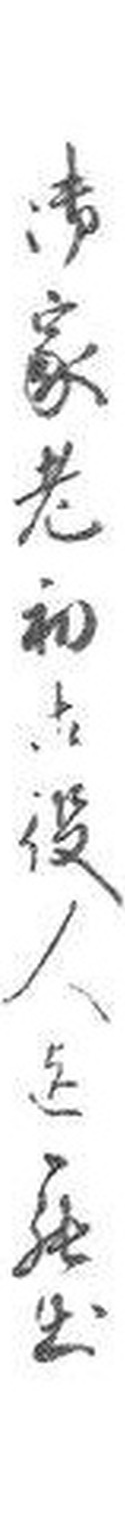御家老初御役人迄罷出
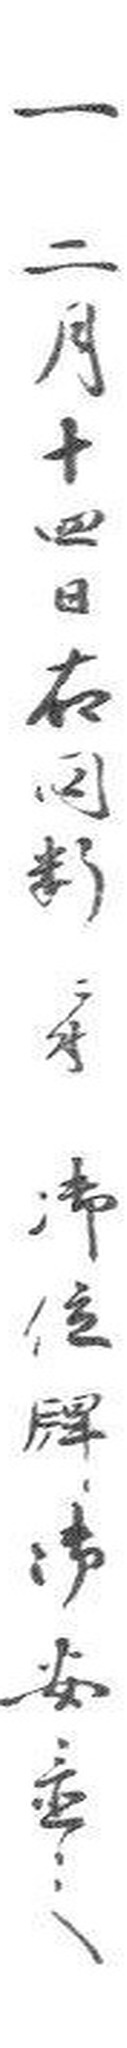一二月十四日右同断ニ付御位牌御安置之
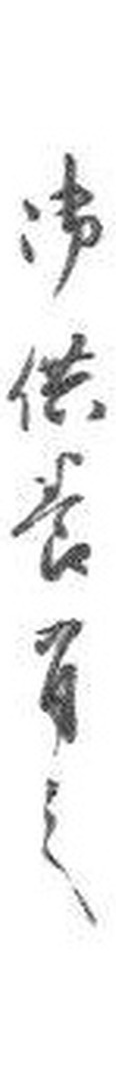御供養有之
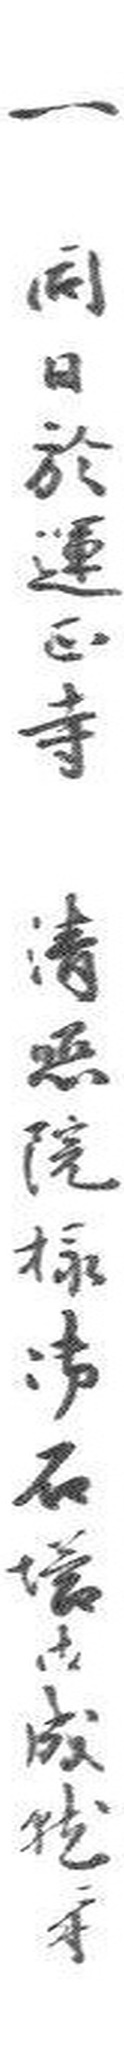一同日於運正寺清照院様御石塔御成就ニ付
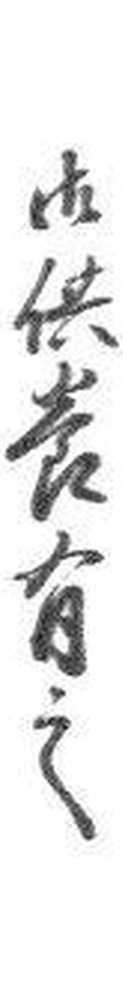御供養有之
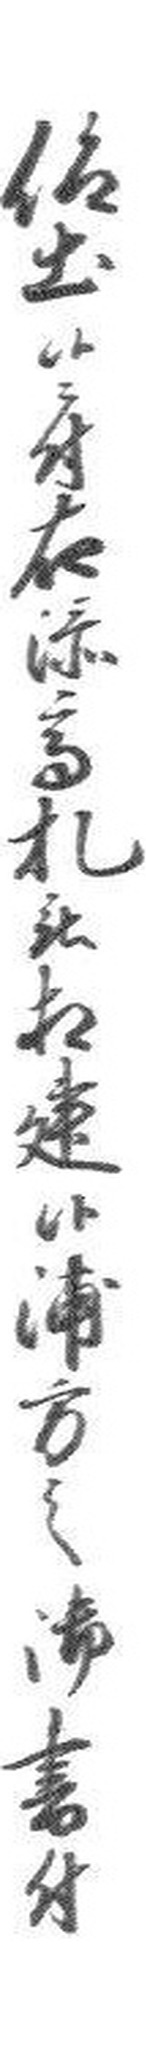仰出候ニ付右添髙札被相建候浦方之御書付
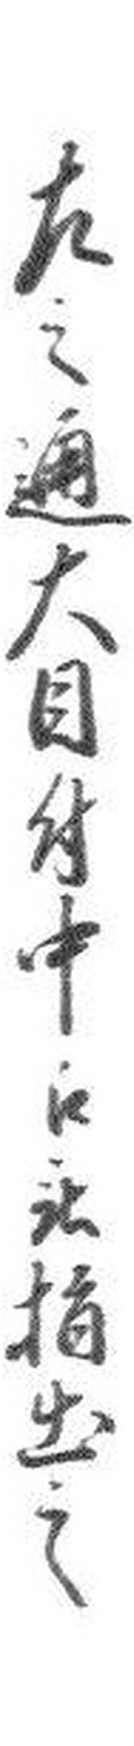左之通大目付中江被指出之
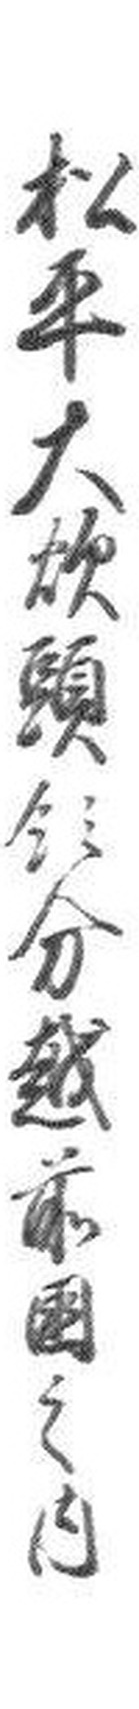松平大炊頭領分越前國之内
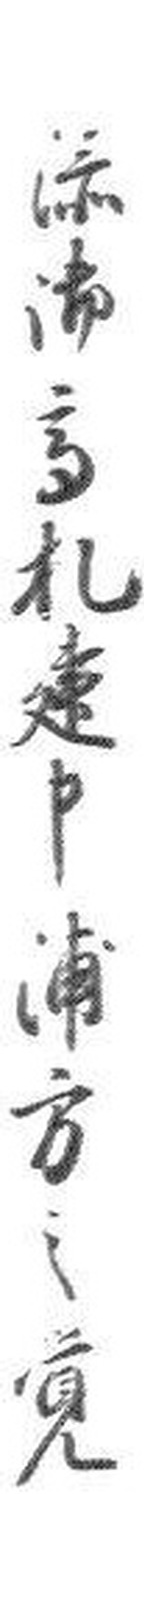添御髙札建申浦方之覚
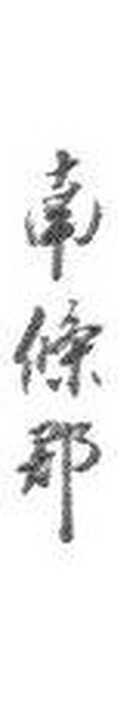南條郡
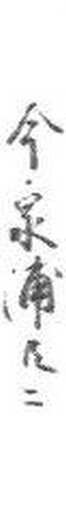今泉浦共ニ
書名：家譜 二十九 吉邦公 従正徳二年到正徳三年
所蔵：福井県文書館 Fukui Prefectural Archives
